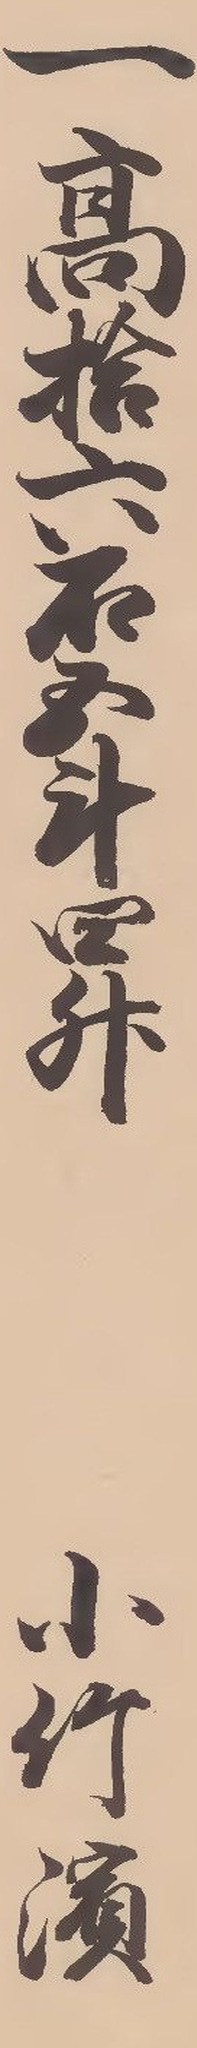一高拾六石五斗四升小竹浜
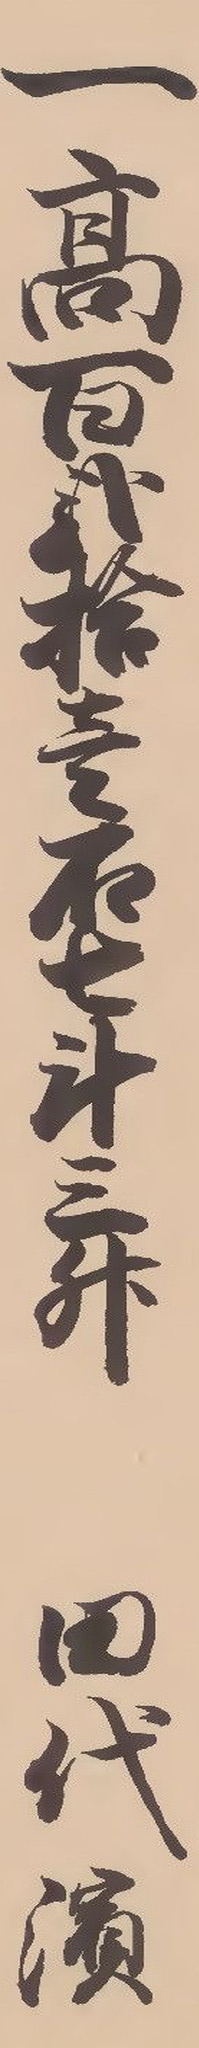一高百弐拾壱石七斗三升田代浜
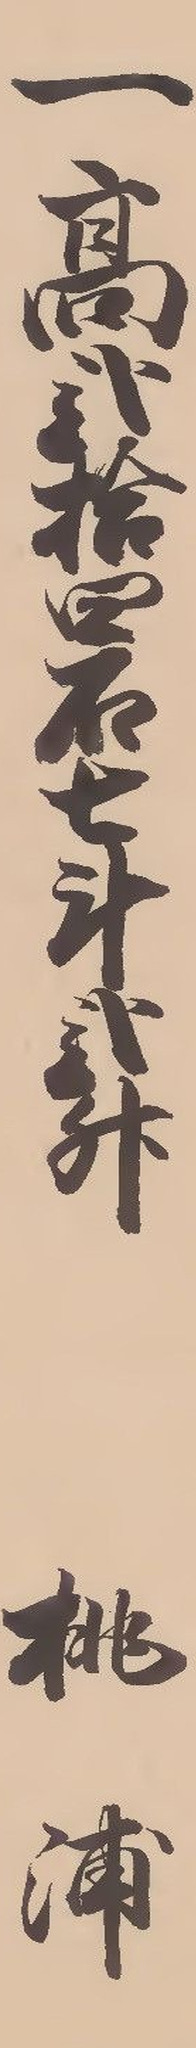一高弐拾四石七斗弐升桃浦
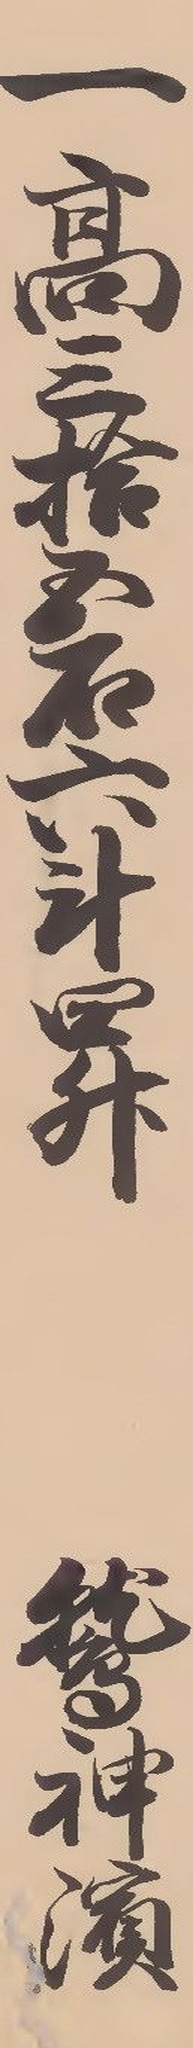一高三拾五石六斗四升鷲神浜
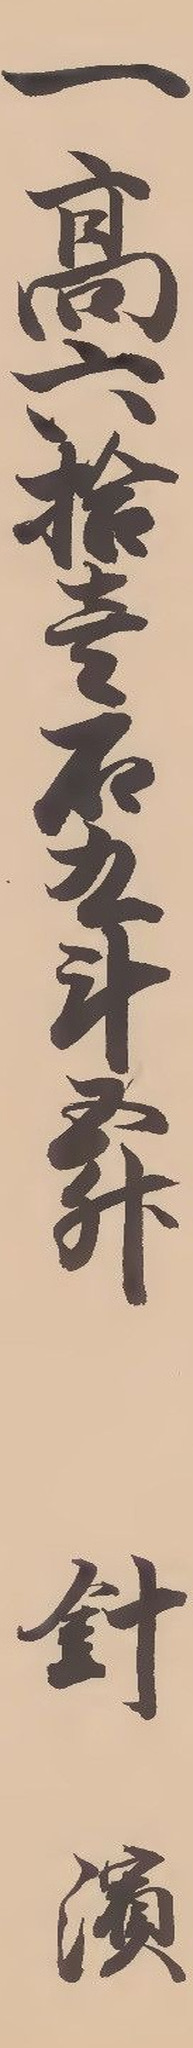一高六拾壱石九斗五升針浜
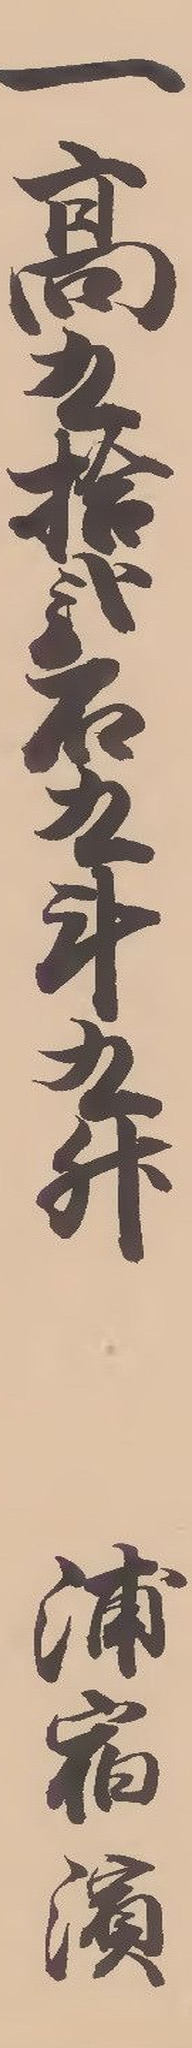一高九拾弐石九斗九升浦宿浜

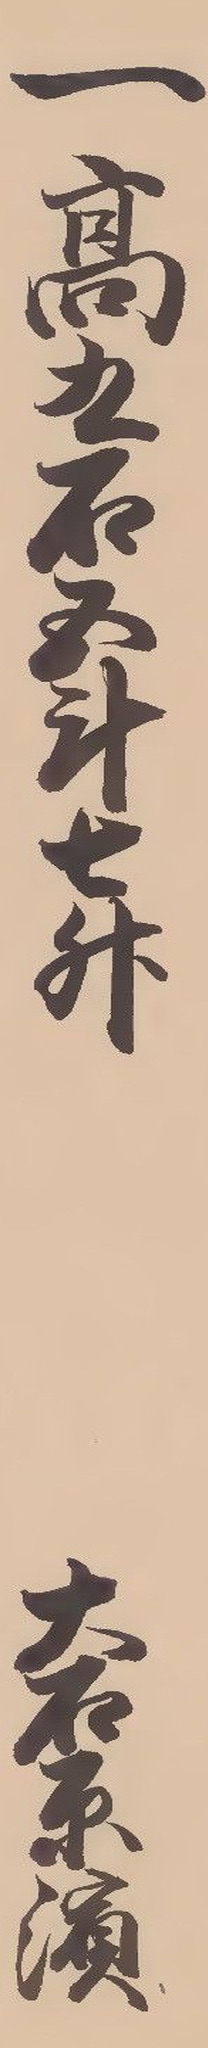一高九石五斗七升大石原浜
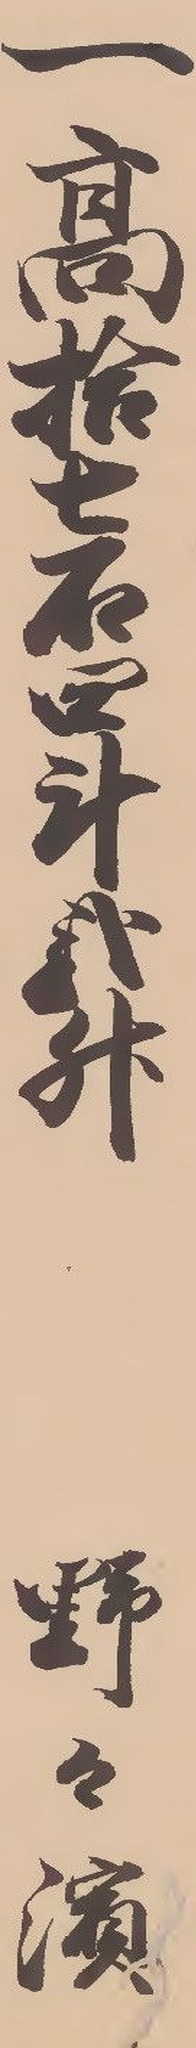一高拾七石四斗弐升野々浜
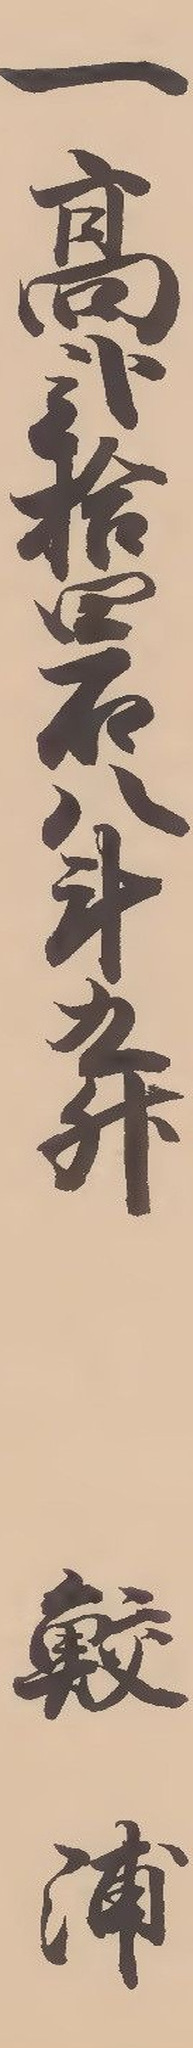一高弐拾四石八斗九升鮫浦
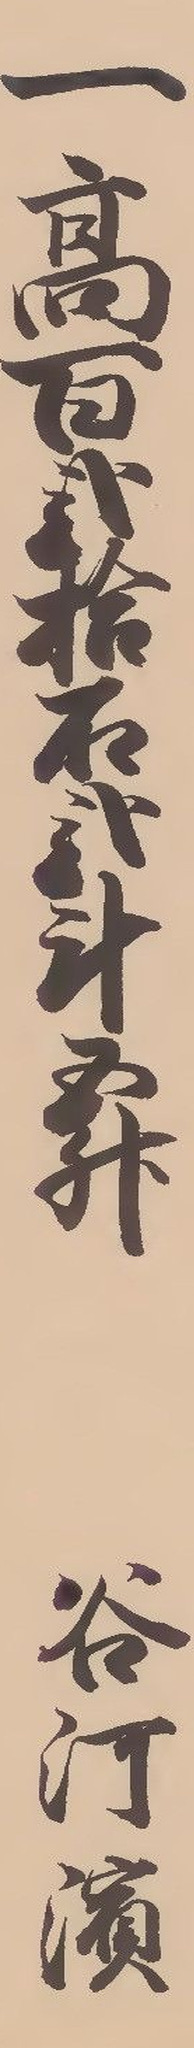一高百弐拾石弐斗五升谷河浜

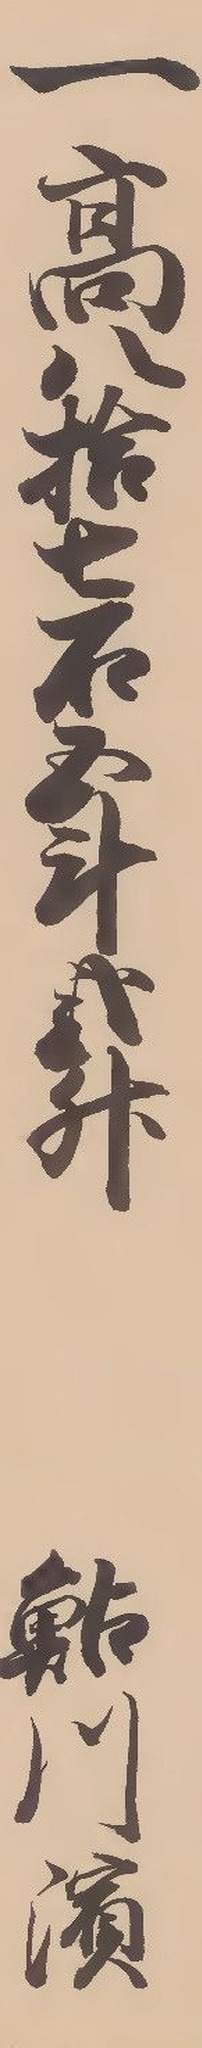一高八拾七石五斗弐升鮎川浜
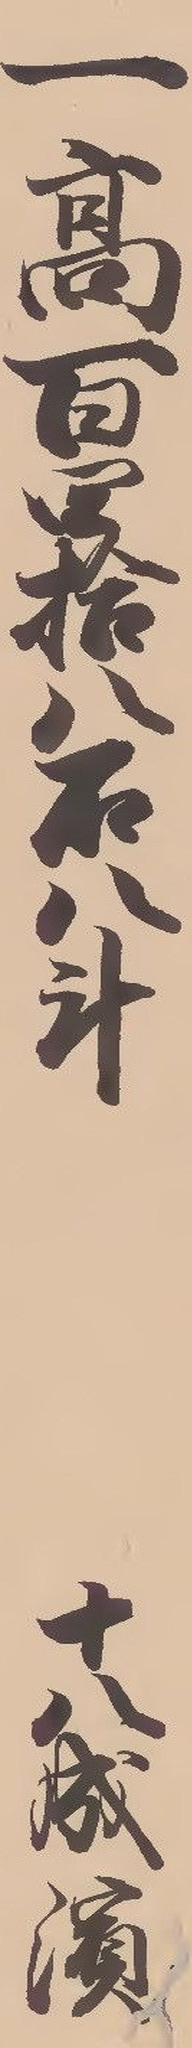一高百四拾八石八斗十八成浜
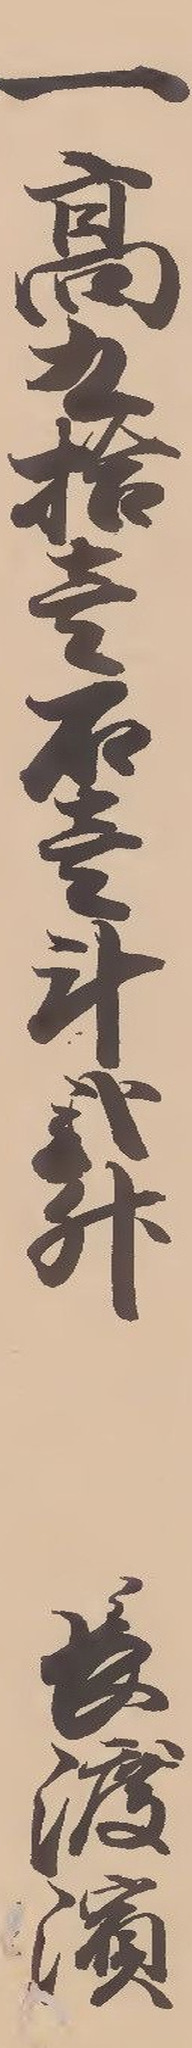一高九拾壱石壱斗弐升長渡浜
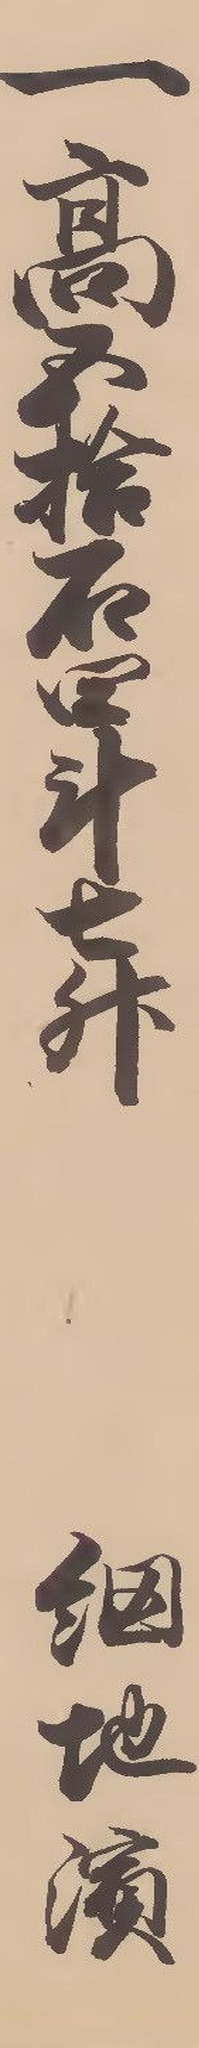一高五拾石四斗七升網地浜

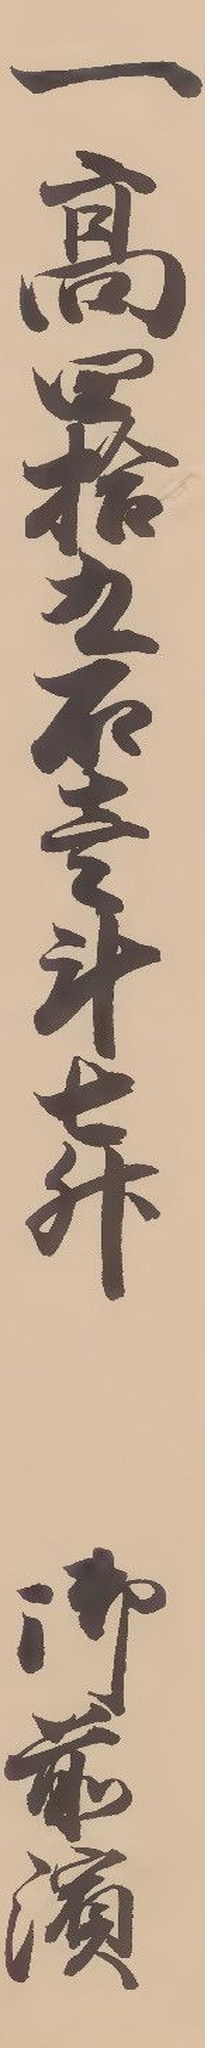一高四拾九石壱斗七升御前浜
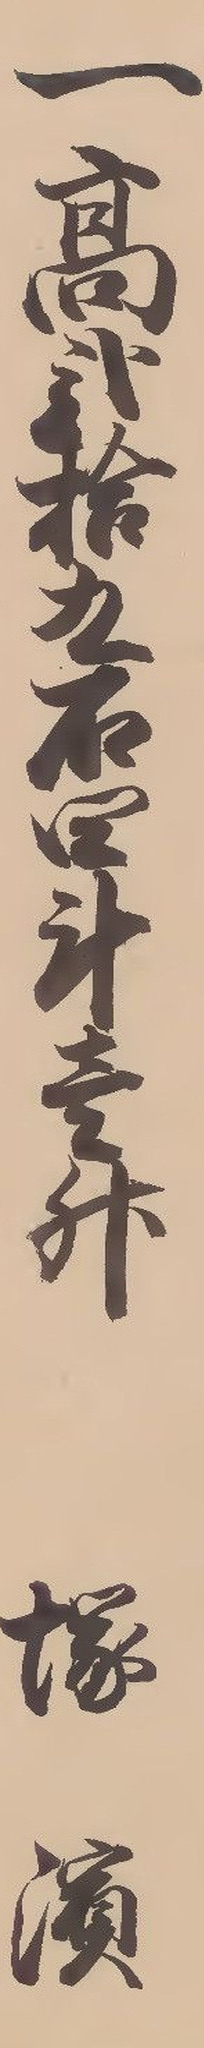一高弐拾九石四斗壱升塚浜
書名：陸奥国郷帳　５
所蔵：国立公文書館 National Archives of Japan
